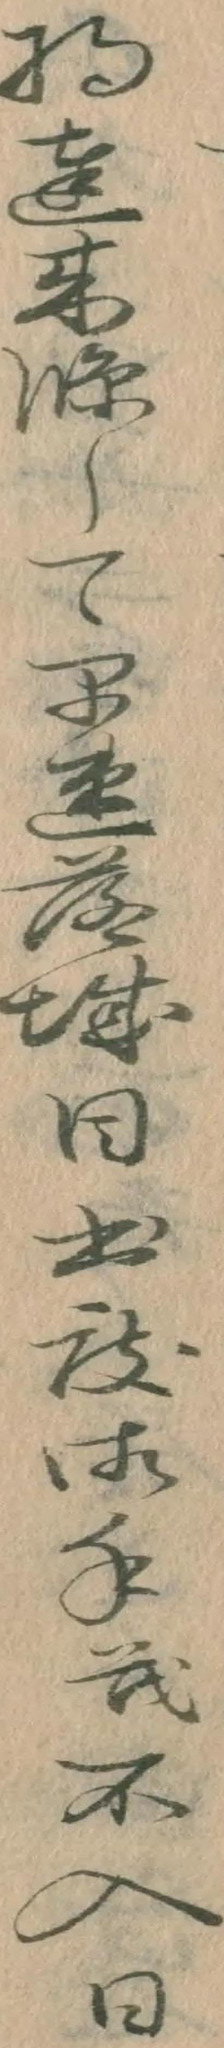将達来條して早速落城目出度御手茂不入日
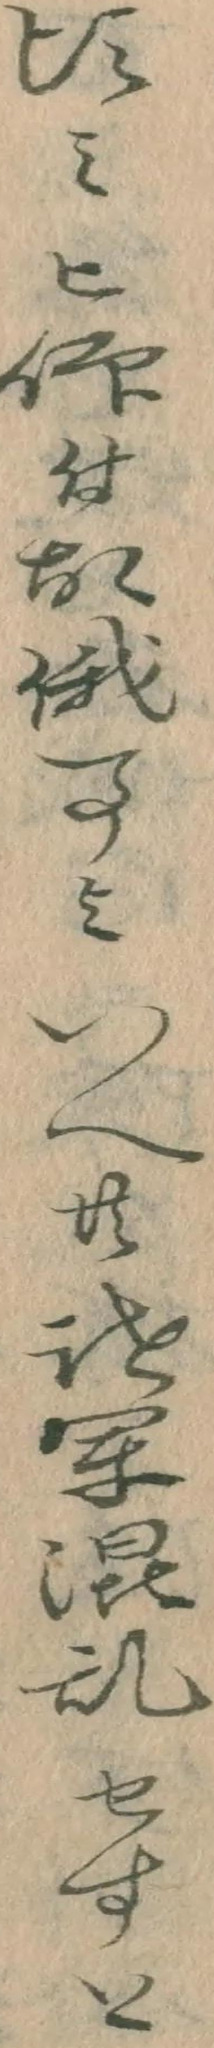頃之被仰付故俄事与いへ共諸軍混乱せすと
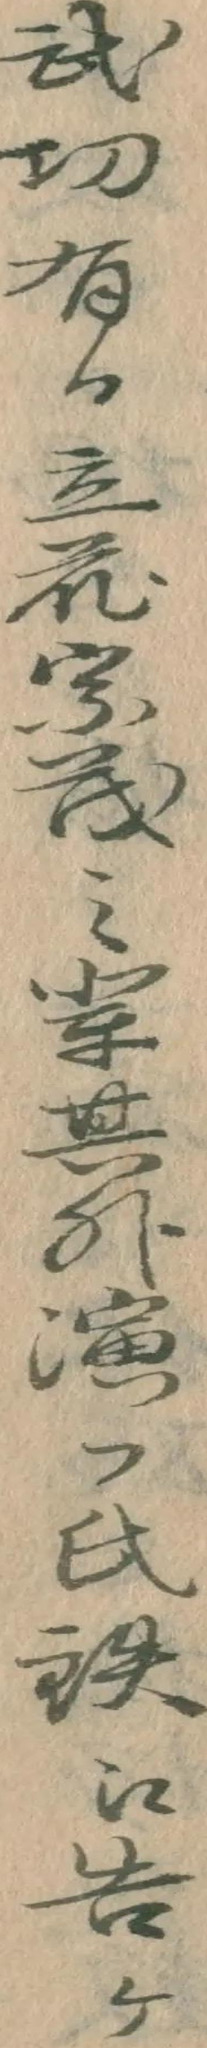武功有る立花宗茂之輩其外演ふ氏鉄江告け
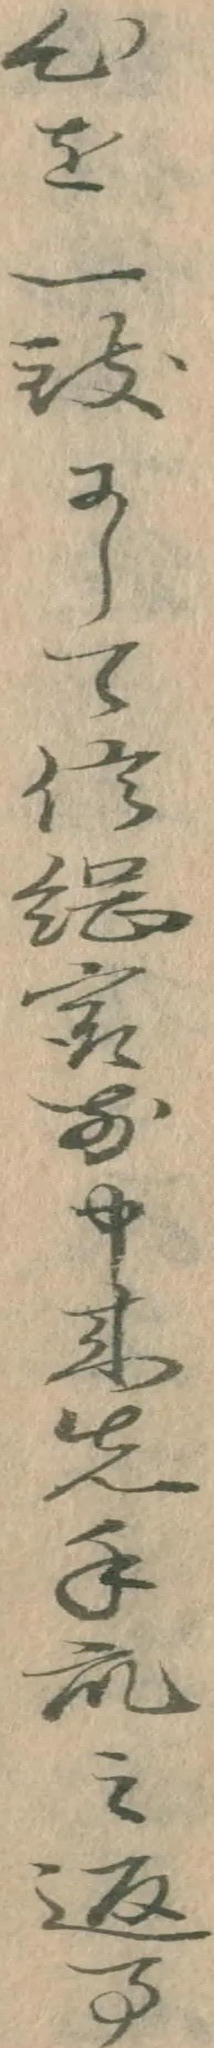心を一致尓して信綱最前申来先手衆之返事
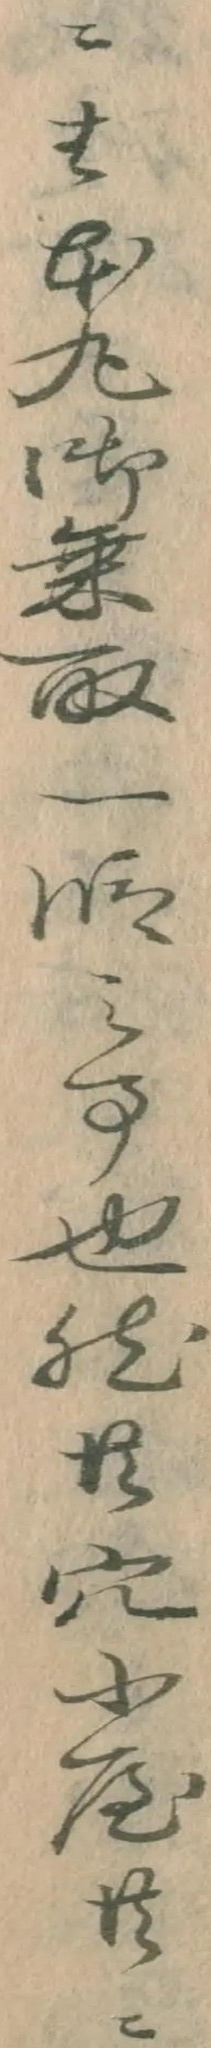に者本丸御乗取一段之事也然共穴小屋共に

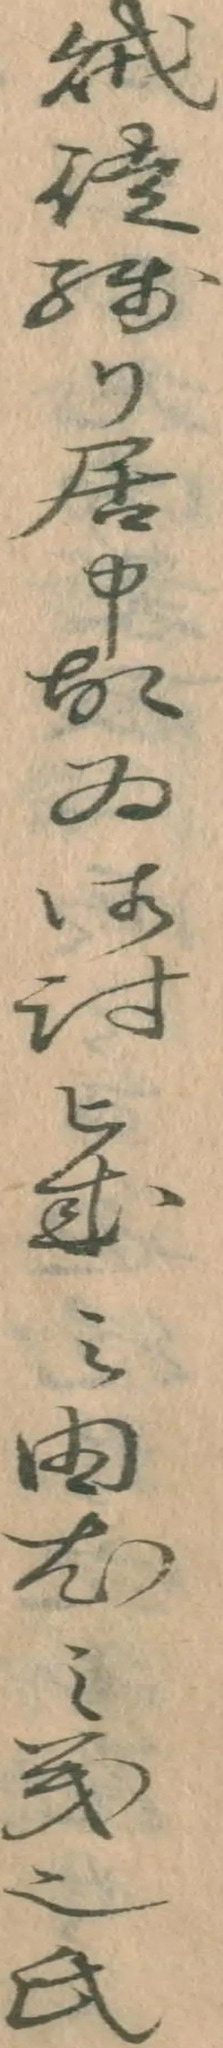賊徒残り居申故ゐ御時被成之由尤之義也氏
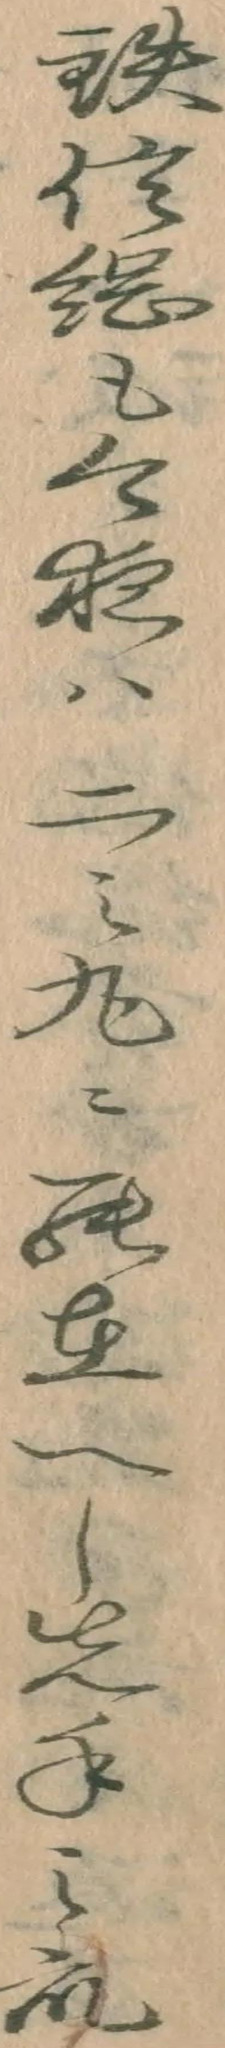鉄信綱も今夜は二之丸に罷在へし先手之衆
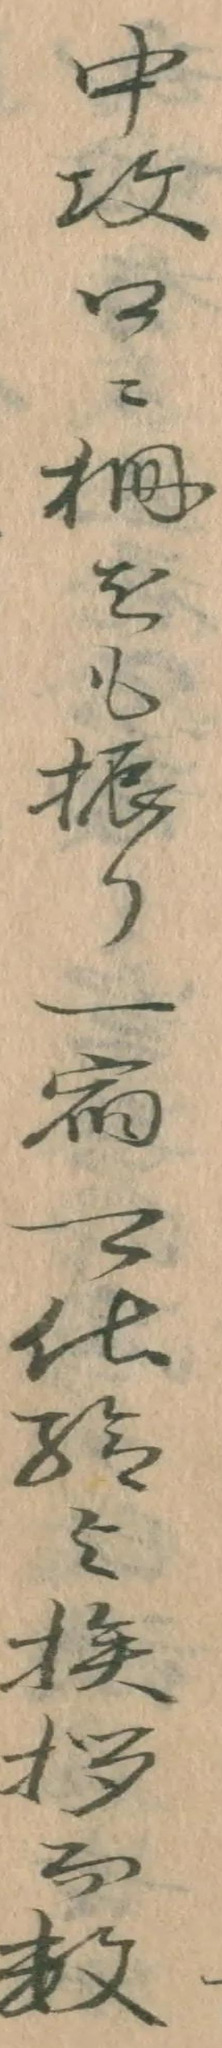中攻口に柵をも振り一宿可仕給与挨拶而数
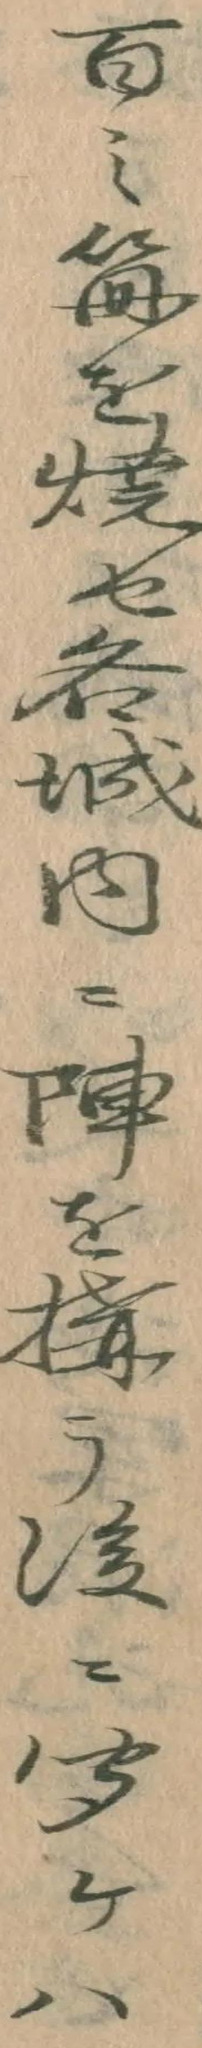百之笧を焼せ各城内に陣を構ふ後に聞けは
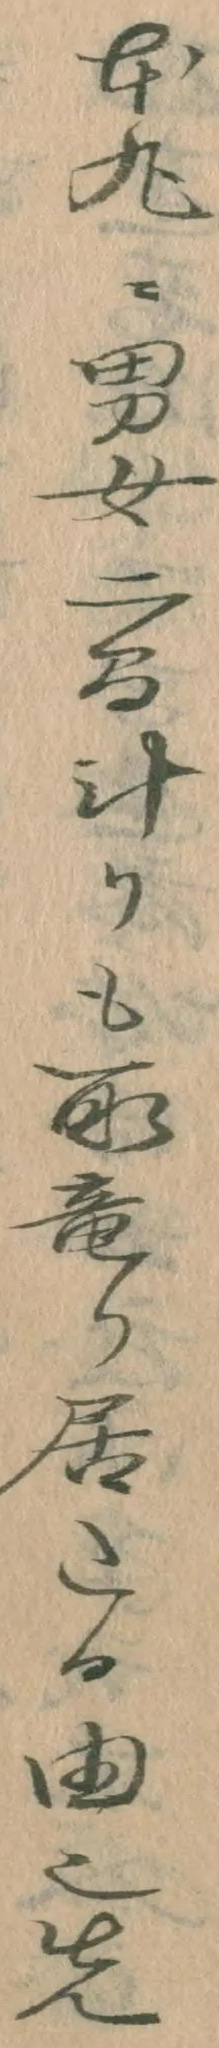本丸に男女二間斗りも取竜り居たる由也先
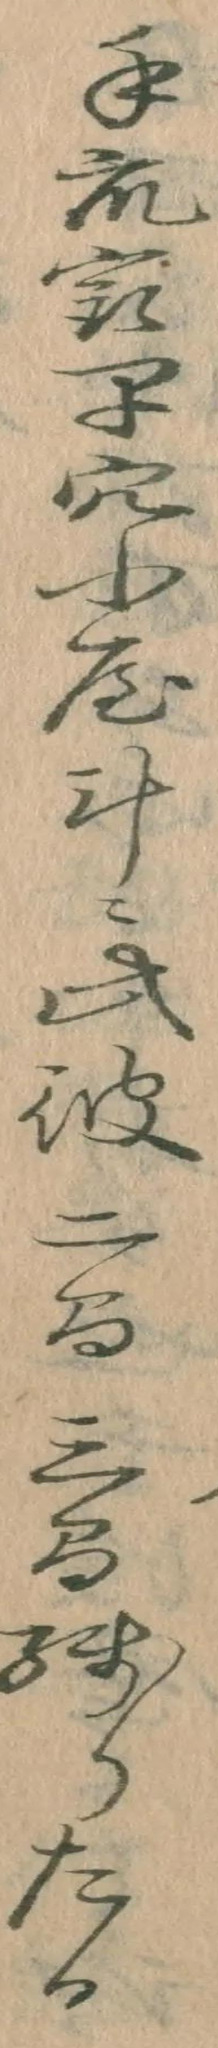手衆最早穴小屋斗に此彼二間三間残りたる
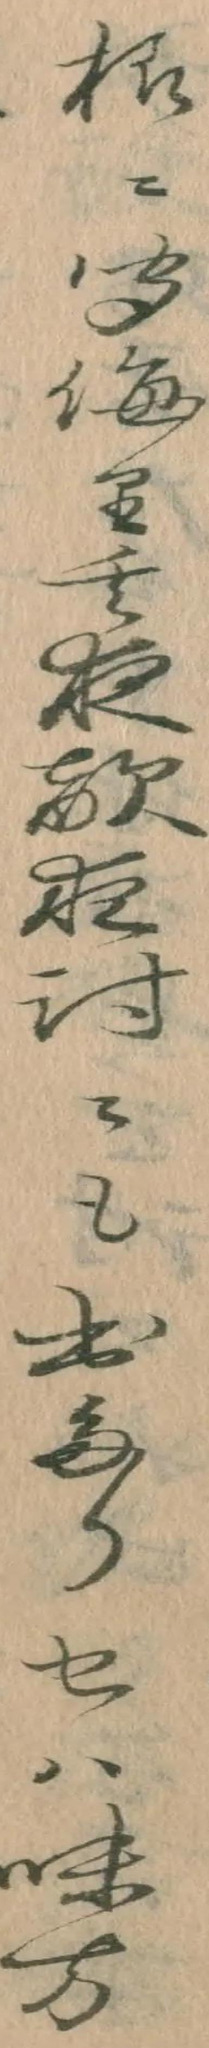様に聞侮里其夜敵夜討にも出多りせは味方
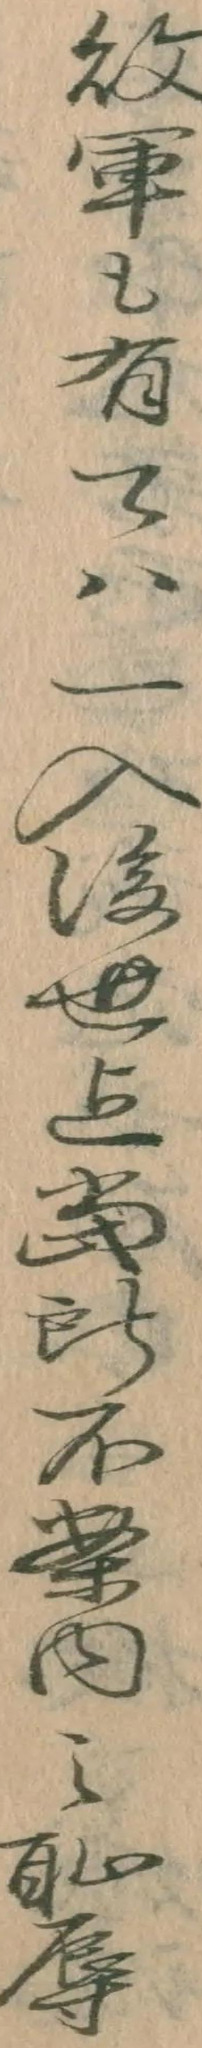敗軍も有ては一入後也迄当所不案内之恥辱
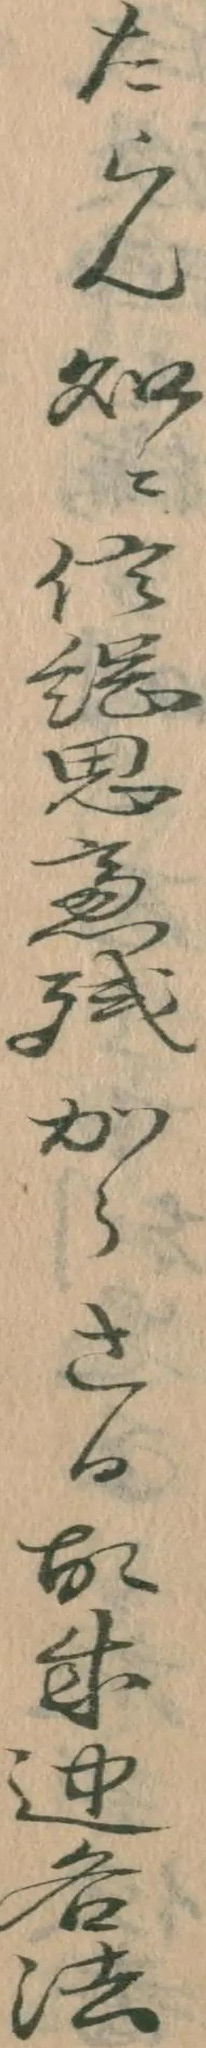たらん処に信綱思慮残からさる故成迚各法
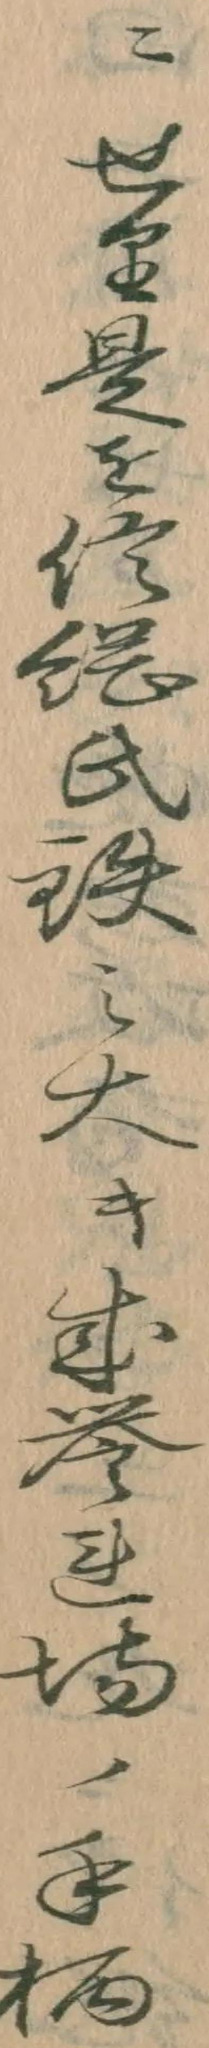にせ里是を信綱氏鉄之大き成誉連場之手柄
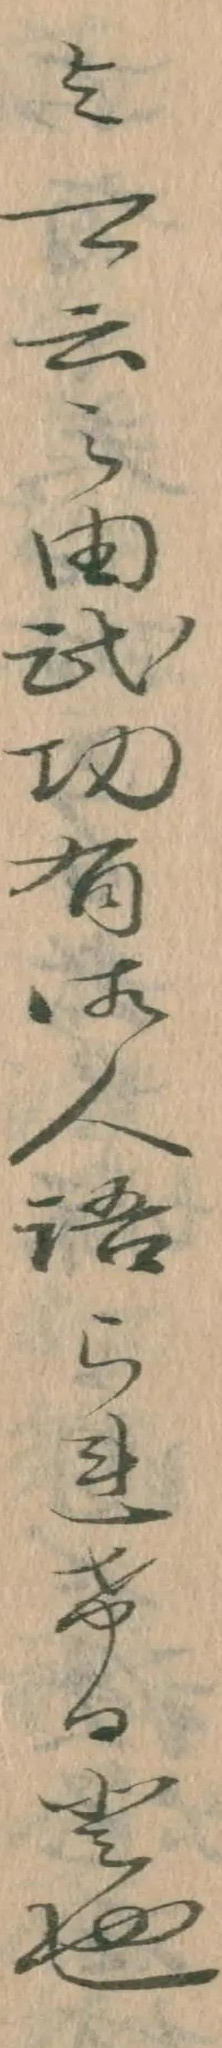与可云之由武功有御人語ら連希る登也
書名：切支丹御退治記 49巻. [7]
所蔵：国立国会図書館 National Diet Library, JAPAN
